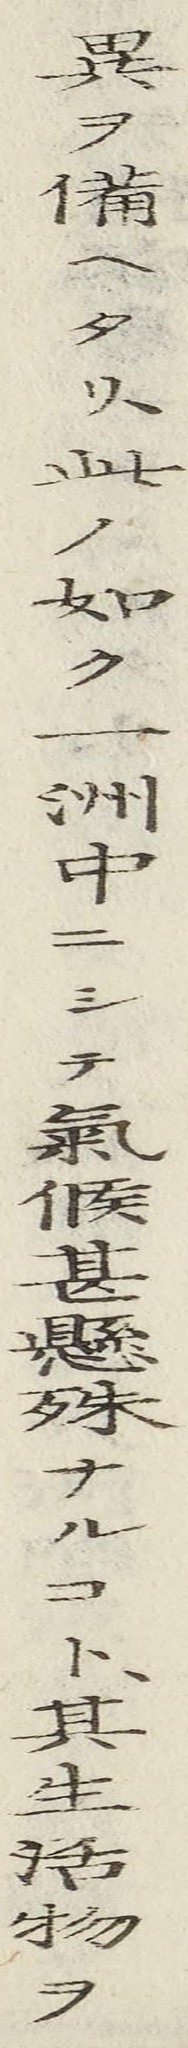異ヲ備ヘタリ、此ノ如ク一洲中ニシテ気候甚懸殊ナルコト、其生活物ヲ
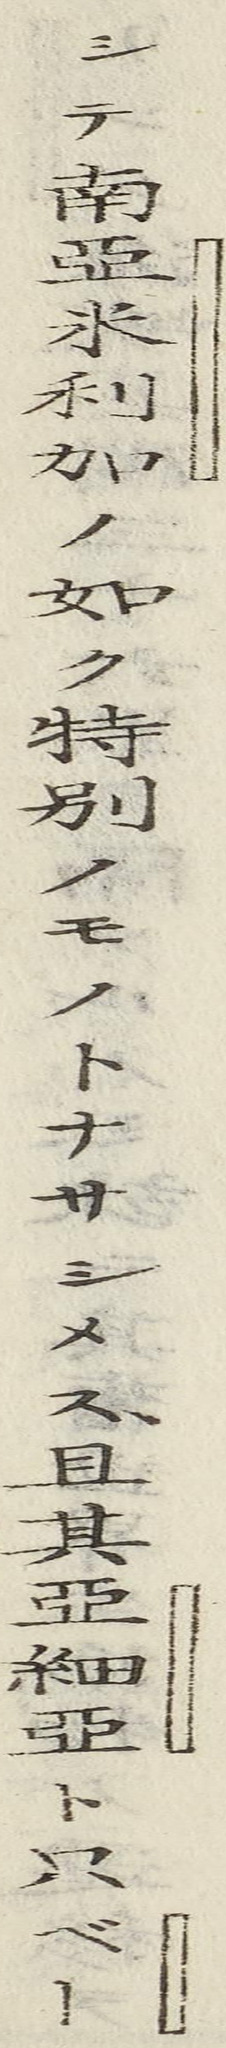シテ南亜米利加ノ如ク特別ノモノトナサシメス、且其亜細亜ト只ベー

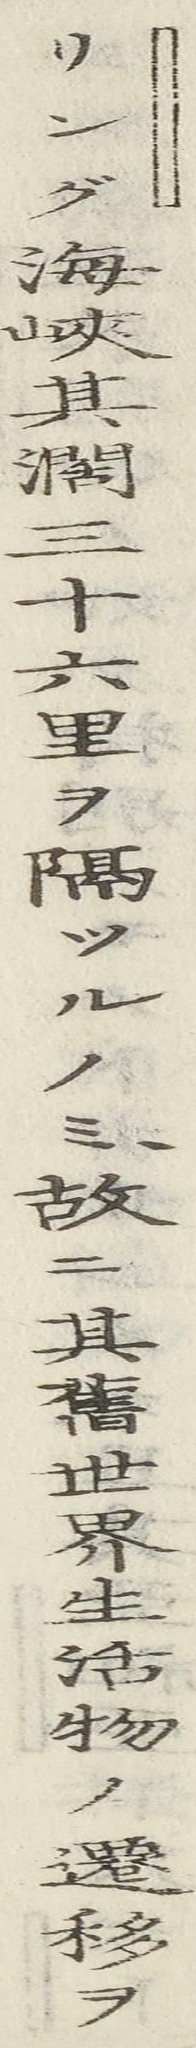リング海峡其濶三十六里ヲ隔ツルノミ、故ニ其旧世界生活物ノ遷移ヲ
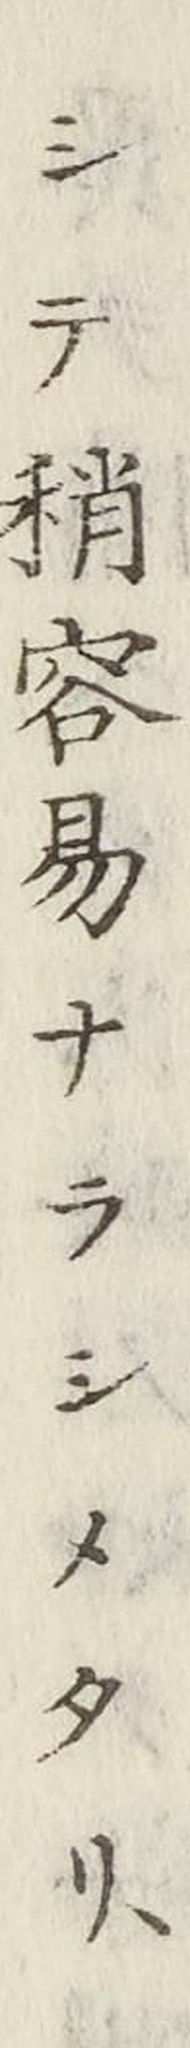シテ稍容易ナラシメタリ、
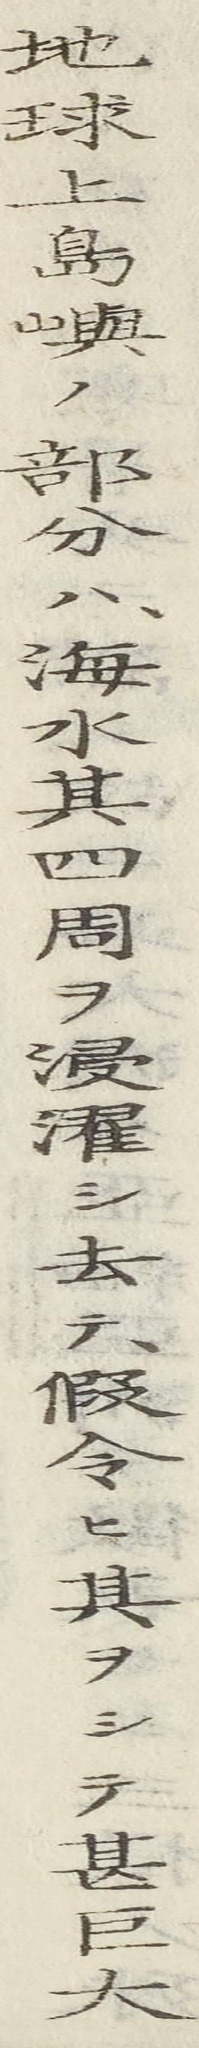地球上島嶼ノ部分ハ、海水其四周ヲ浸濯シ去テ、仮令ヒ其ヲシテ甚巨大
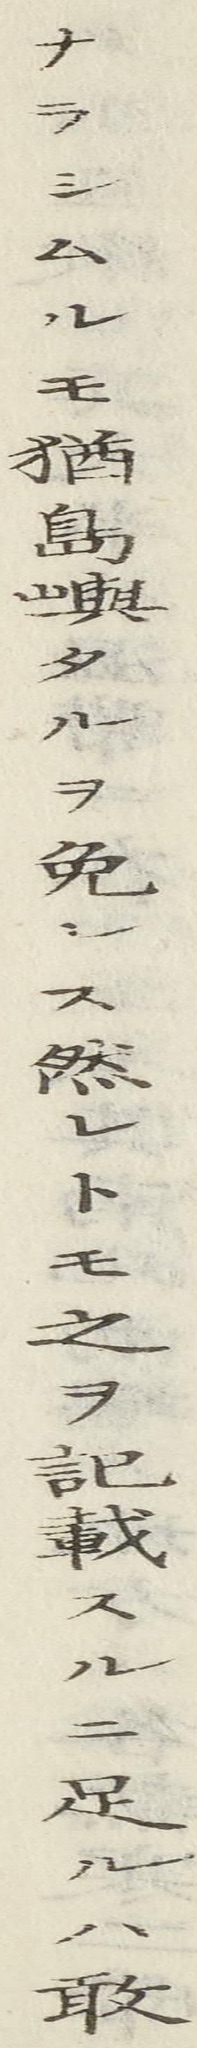ナラシムルモ猶島嶼タルヲ免レス然レトモ之ヲ記載スルニ足ルハ敢
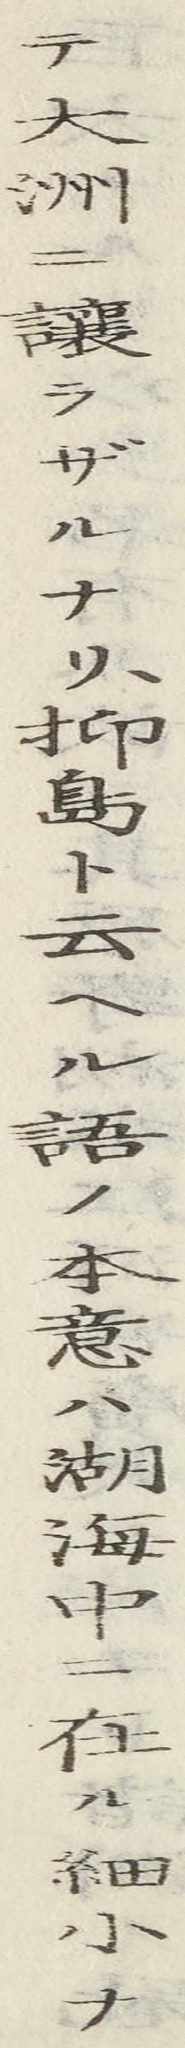テ大洲ニ譲ラザルナリ、抑島ト云ヘル語ノ本意ハ湖海中ニ在ル細小ナ
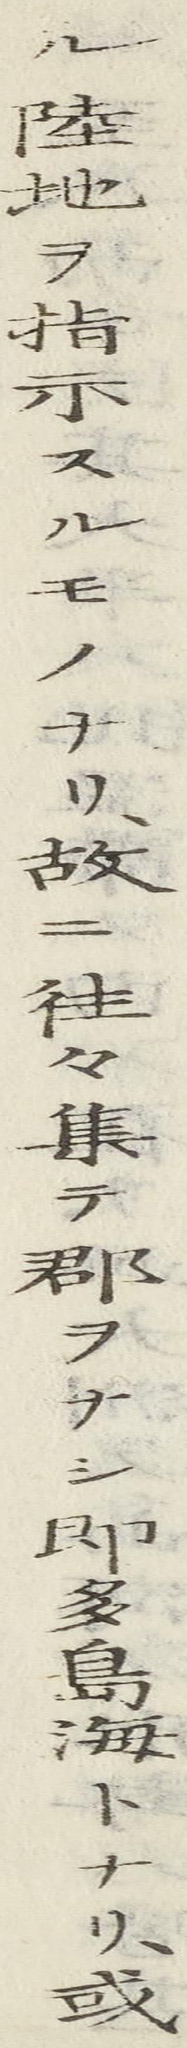ル陸地ヲ指示スルモノナリ、故ニ往々集テ郡ヲナシ即多島海トナリ、或
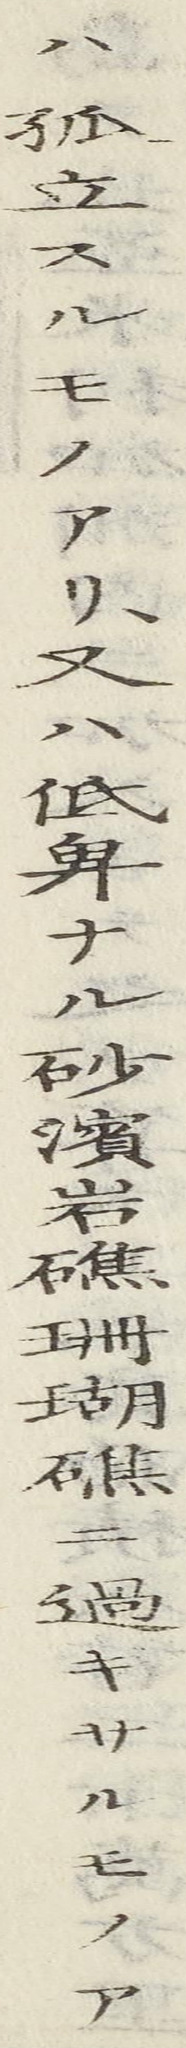ハ孤立スルモノアリ、又ハ低卑ナル砂浜岩礁珊瑚礁ニ過キサルモノア
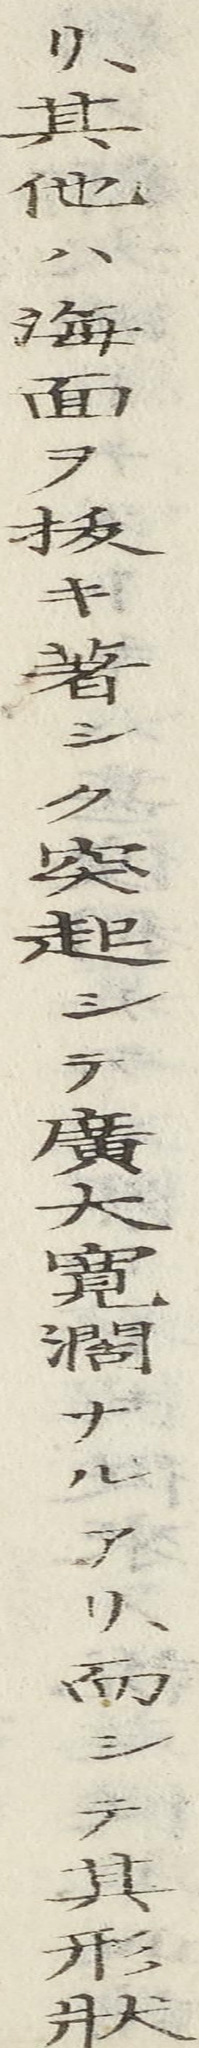リ、其他ハ海面ヲ抜キ著シク突起シテ広大寛濶ナルアリ、而シテ其形状
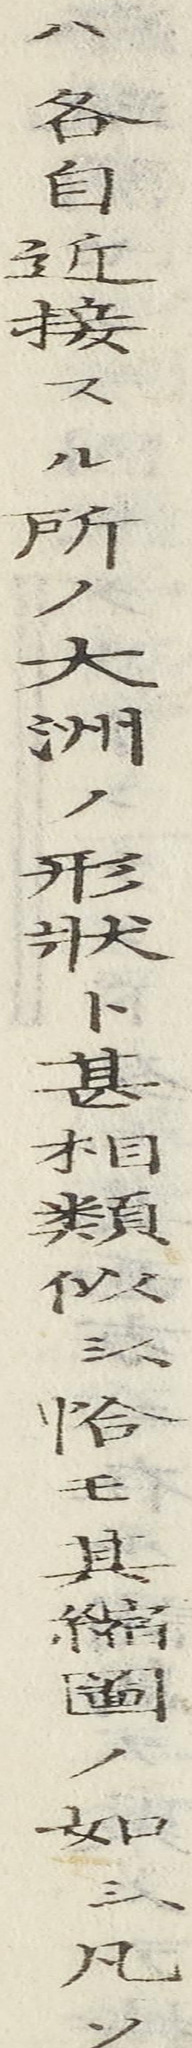ハ各自近接スル所ノ大洲ノ形状ト其相類似シ、恰モ其縮図ノ如シ、凡ソ
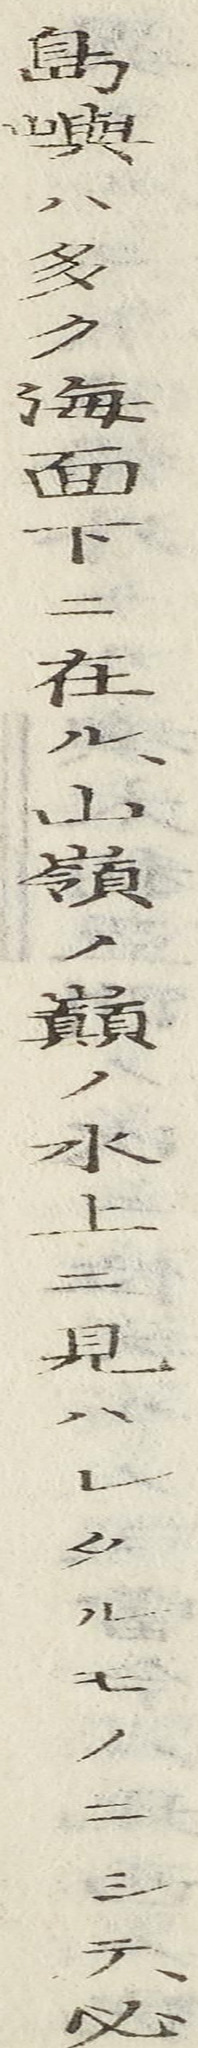島嶼ハ多ク海面下ニ在ル、山領ノ巓ノ水上ニ見ハレタルモノニシテ、必
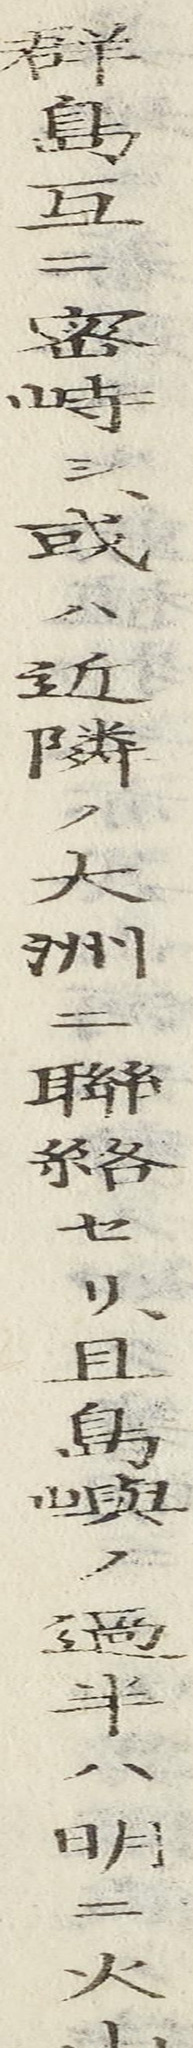群島互ニ密峙シ、或ハ近隣ノ大洲ニ連絡セリ、且島嶼ノ過半ハ明ニ火山
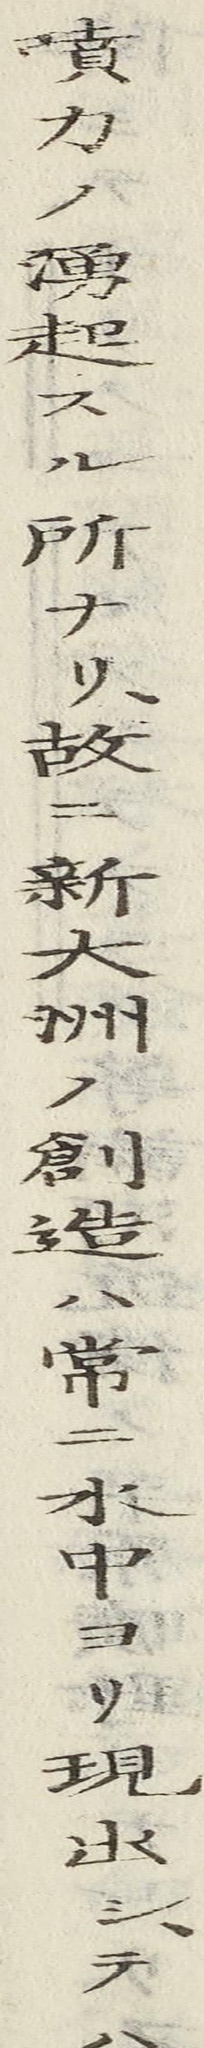噴力ノ湧起スル所ナリ、故ニ新大洲ノ創造ハ常ニ水中ヨリ現出シ、テハ
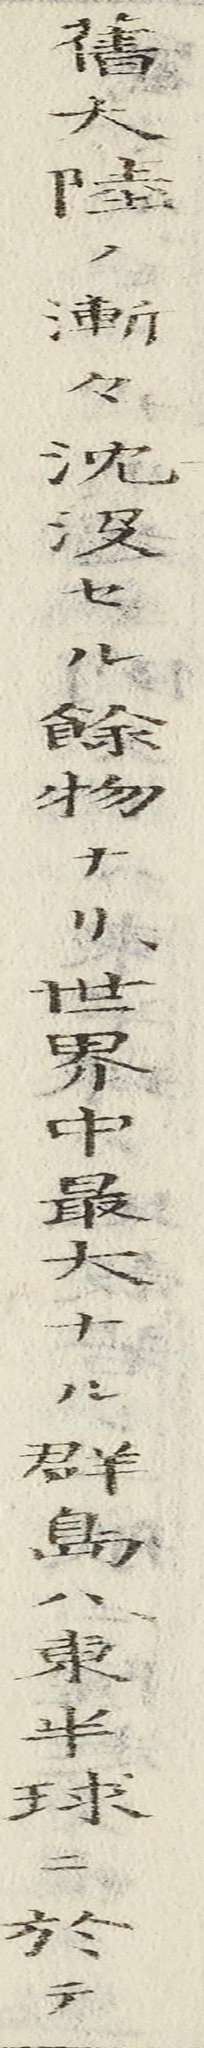旧大陸ノ漸々沈没セル余物ナリ、世界中最大ナル群島ハ、東半球ニ於テ
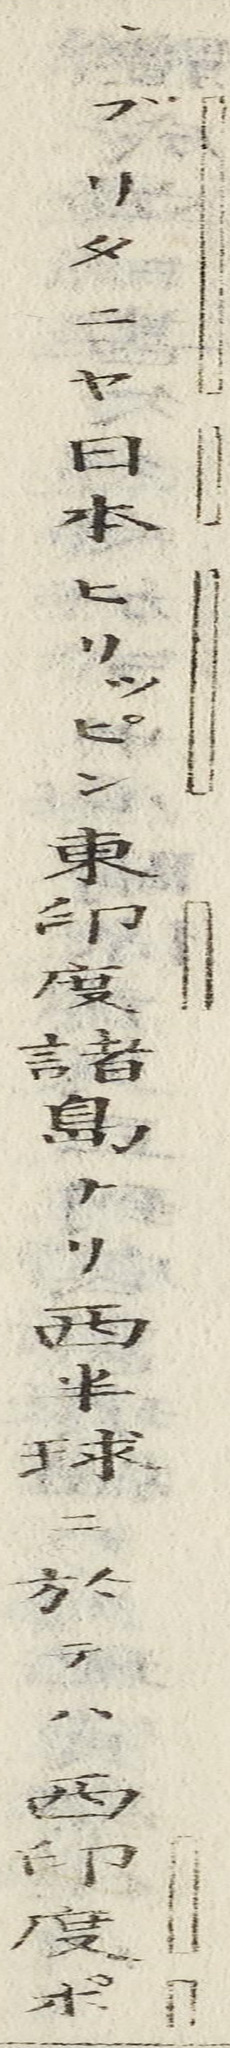ハブリタニヤ日本ヒリッピン東印度諸島ナリ西半球ニ於テハ西印度ポ
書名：百科全書　地文學　全
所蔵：東京大学地震研究所図書室 Earthquake Research Institute Library, The University of Tokyo, JAPAN
